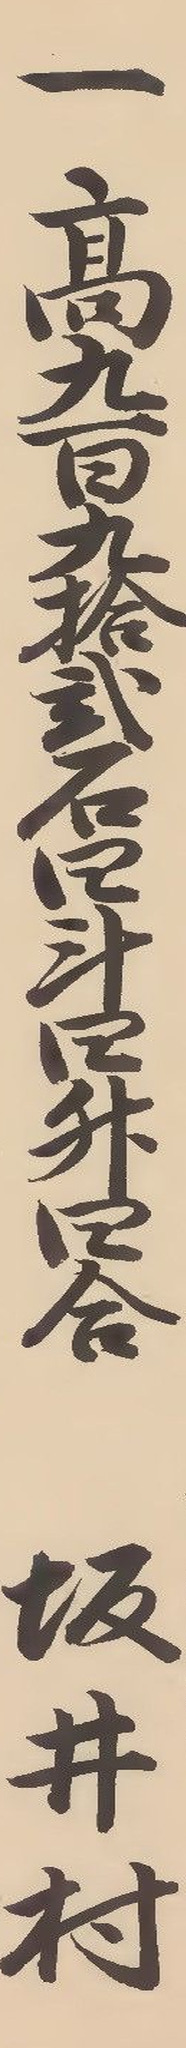一高九百九拾弐石四斗四升四合坂井村
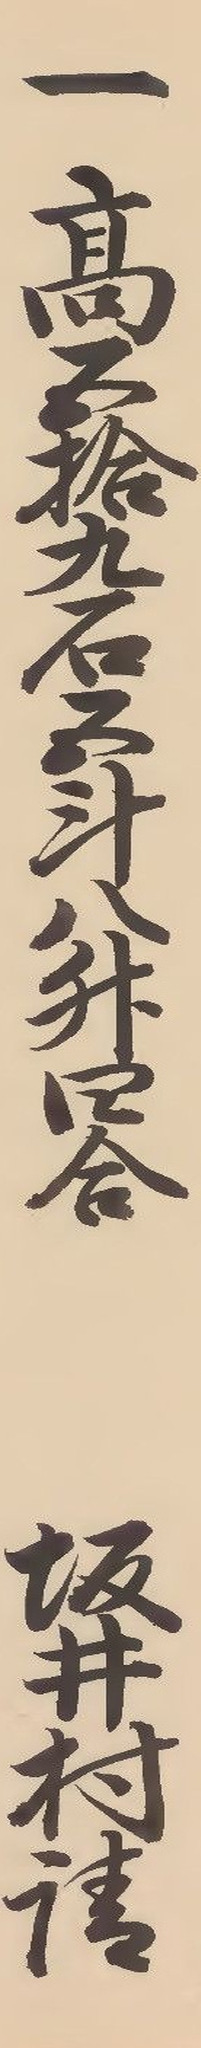一高五拾九石五斗八升四合坂井村請
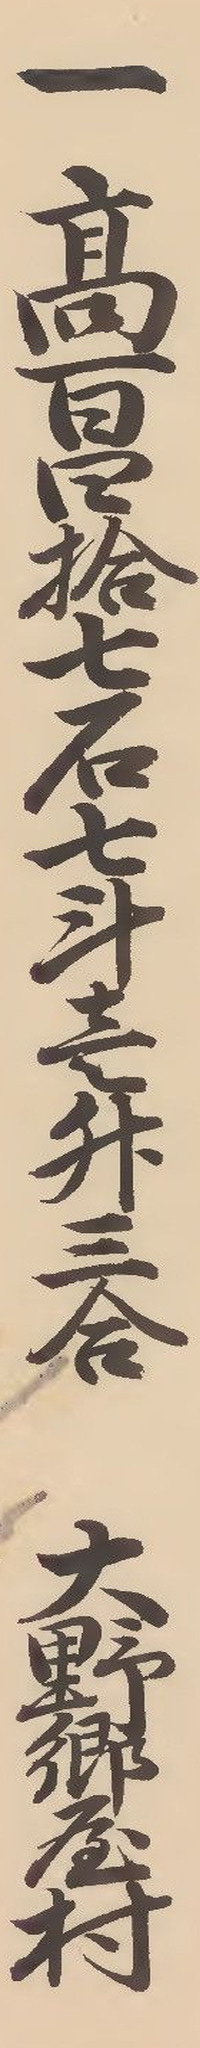一高百四拾七石七斗壱升三合大野郷屋村

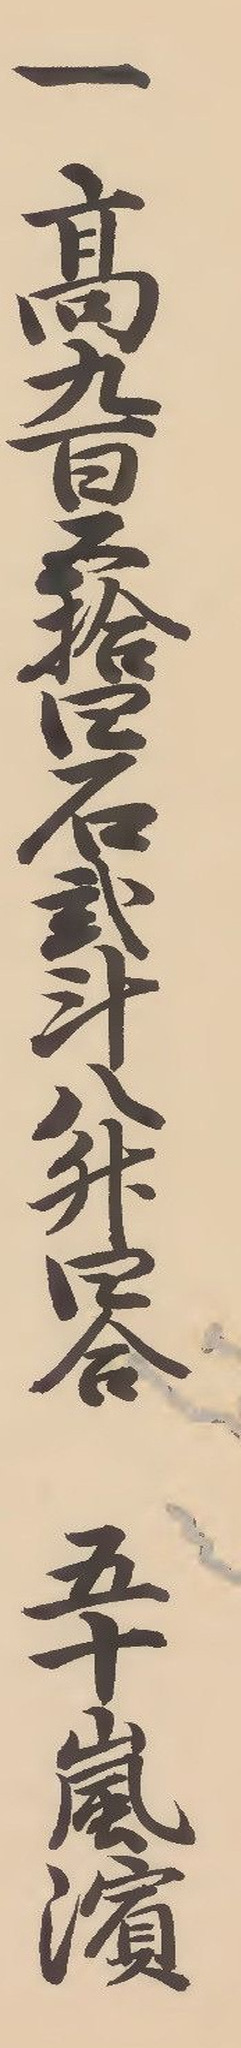一高九百五拾四石弐斗八升四合五十嵐浜
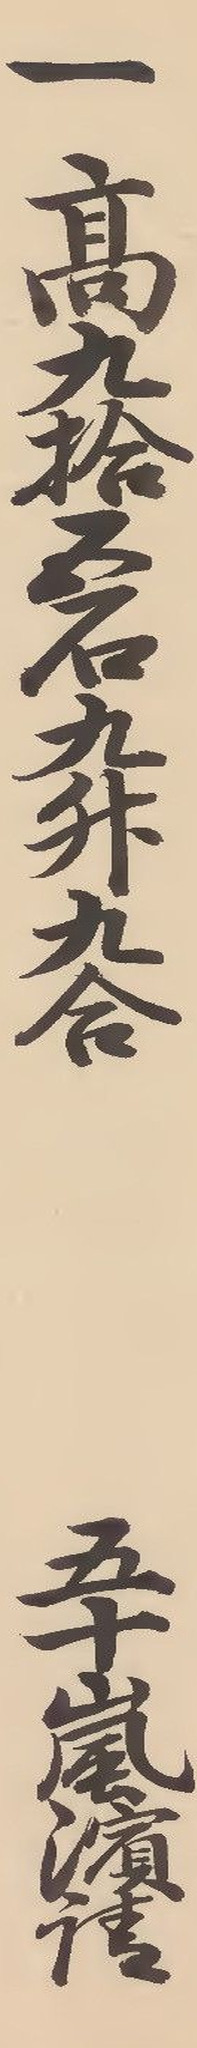一高九拾五石九升九合五十嵐浜請
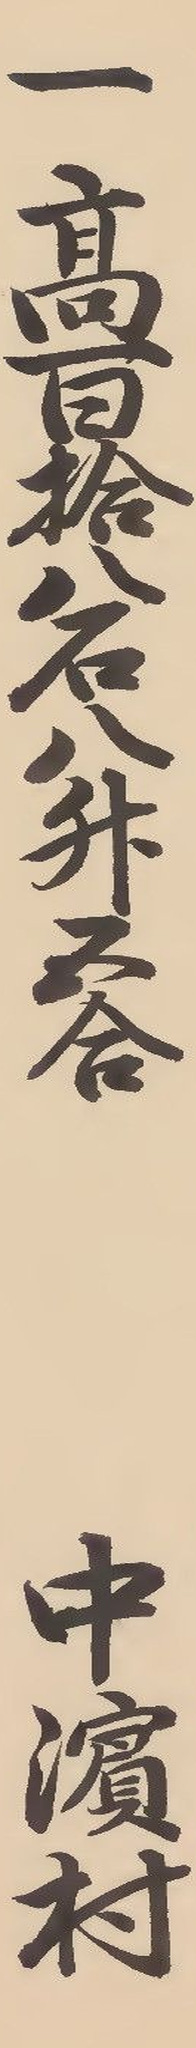一高百拾八石八升五合中浜村
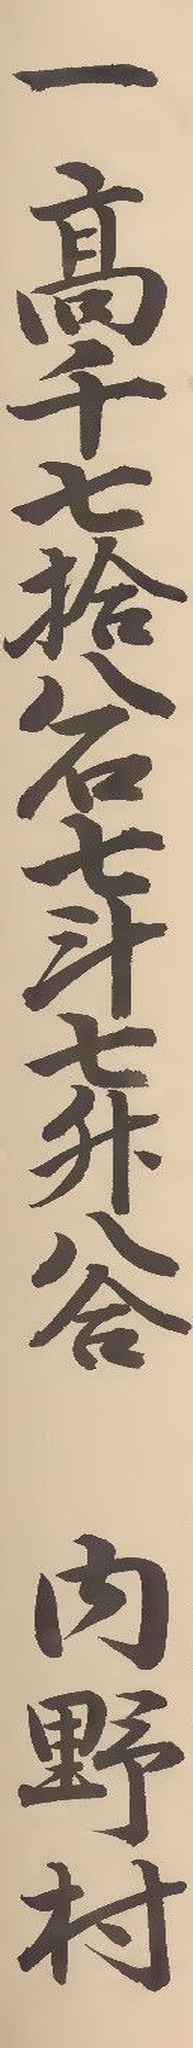一高千七拾八石七斗七升八合内野村
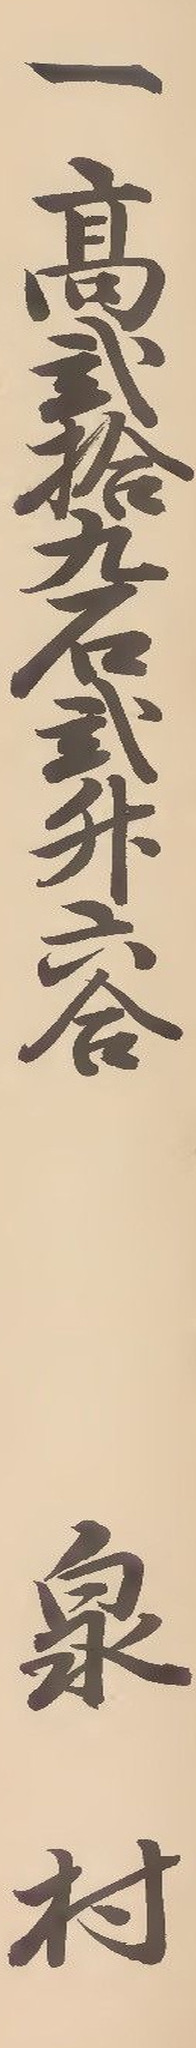一高弐拾九石弐升六合泉村
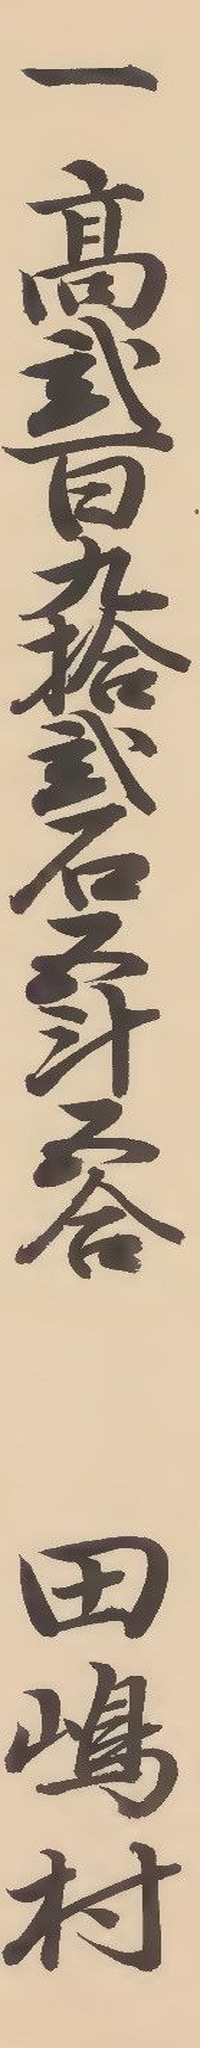一高弐百九拾弐石五斗五合田島村
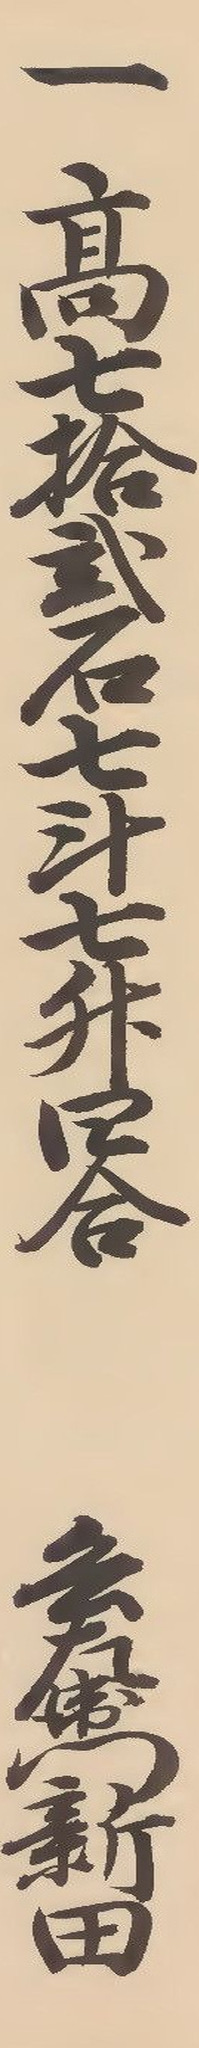一高七拾弐石七斗七升四合兵左衛門新田
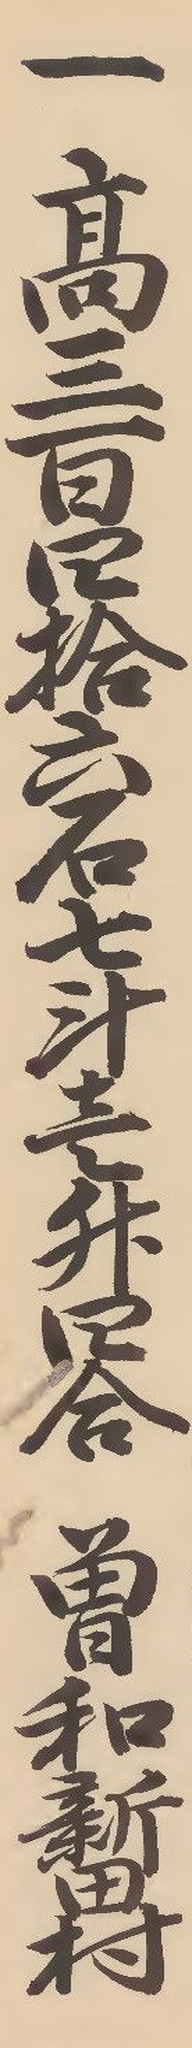一高三百四拾六石七斗壱升四合曽和新田村

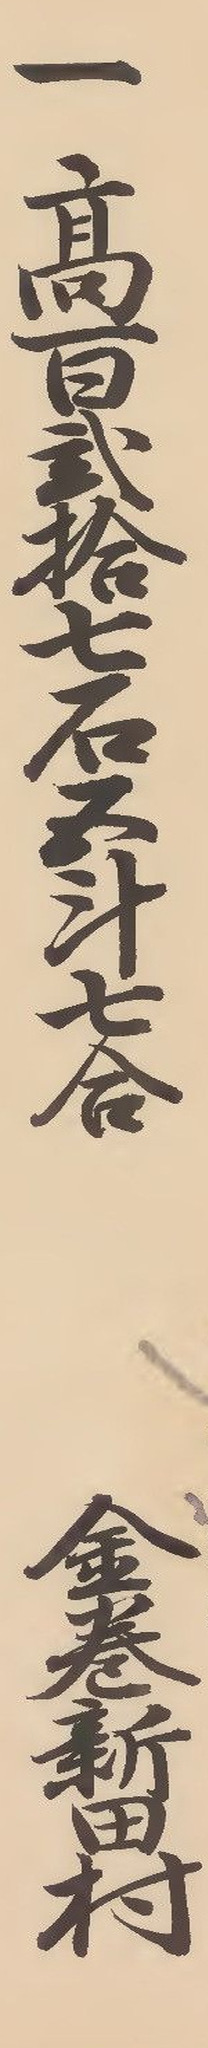一高百弐拾七石五斗七合金巻新田村
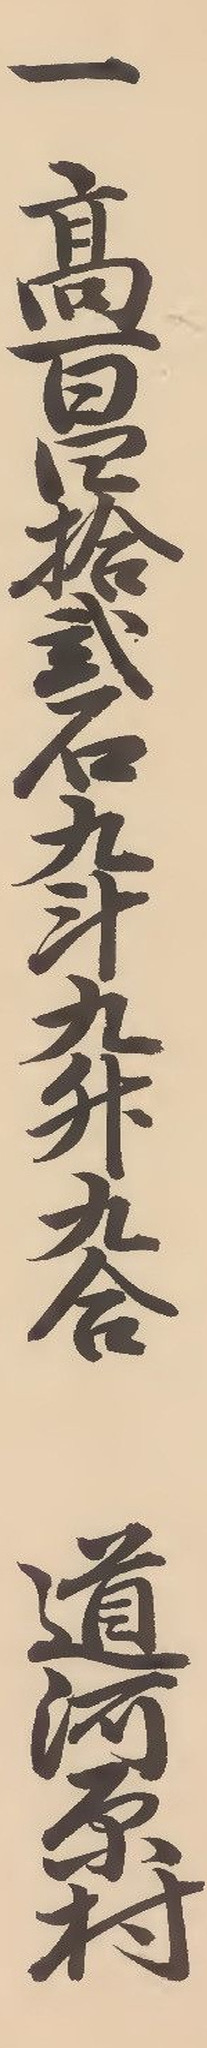一高百四拾弐石九斗九升九合道河原村
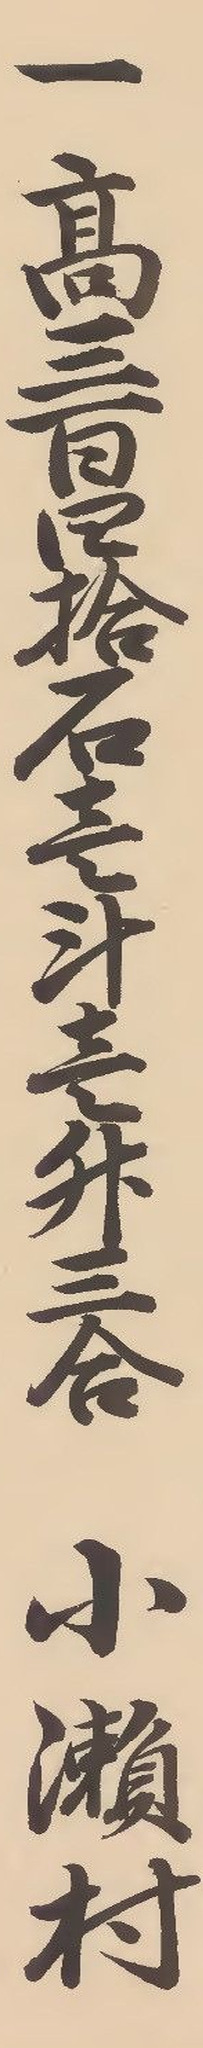一高三百四拾石壱斗壱升三合小瀬村
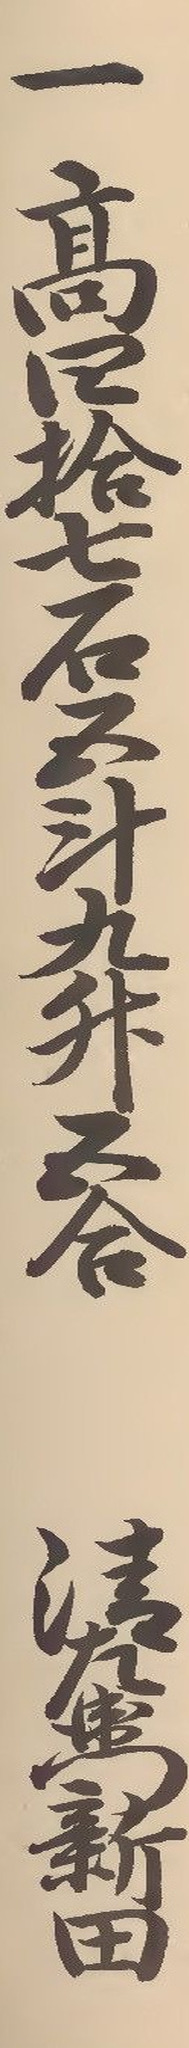一高四拾七石五斗九升五合清左衛門新田
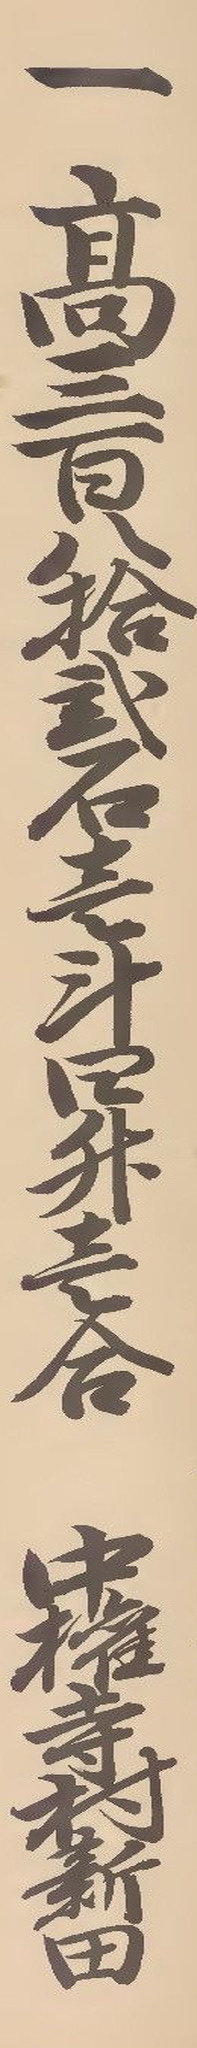一高三百八拾弐石壱斗四升壱合中権寺村新田
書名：越後国郷帳　下
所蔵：国立公文書館 National Archives of Japan
